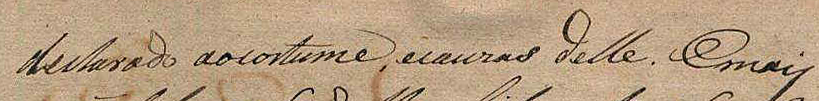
declarado ao costume, e cauzas delle. E mais
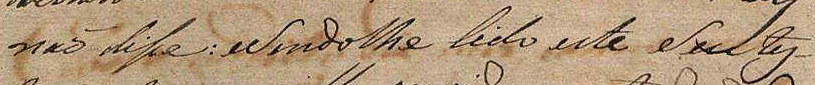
naõ disse: e sendolhe lido este Seu tes
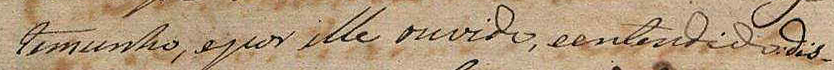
temunho, e por elle ouvido, e entendido dis
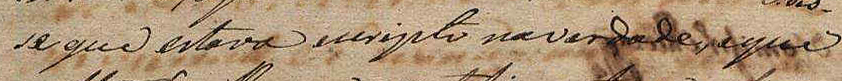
se que estava escripto na verdade, e que
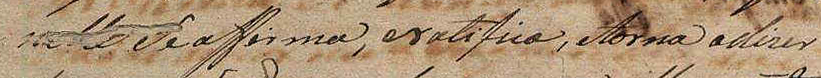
nelle Se affirma, e ratifica, e torna a dizer
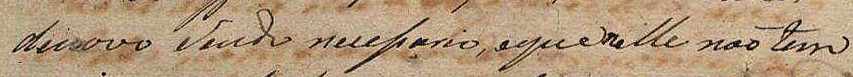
de novo sendo necessario, e que nelle naõ tem
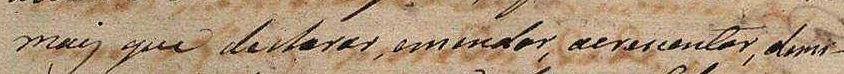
mais que declarar, emendar, acrescentar, demi
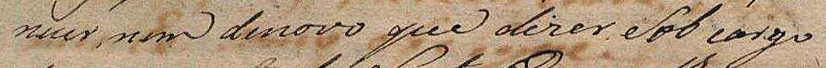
nuir, nem de novo que dizer Sob cargo
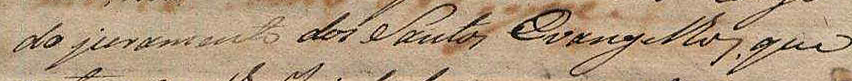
do juramento dos Santos Evangelhos, que
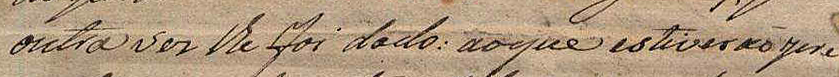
outra vez lhe foi dado: ao que estiveraõ pre
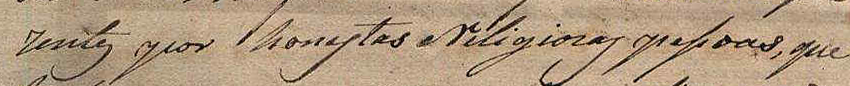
zentes por honestas e religiozas pessoas, que
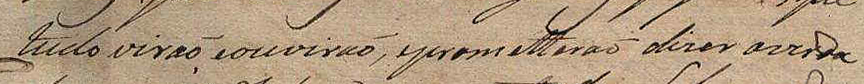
tudo viraõ, e ouviraõ, e prometteraõ dizer a verda
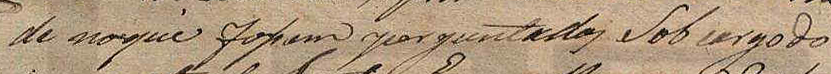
de no que fossem perguntados Sob cargo do
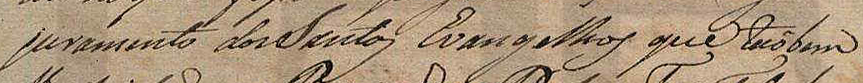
juramento dos Santos Evangelhos que taõbem
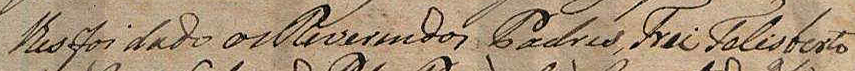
lhes foi dado os Reverendos Padres, Frei Felisberto
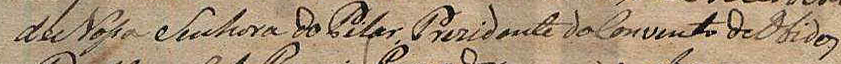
de Nossa Seuhora do Pilar, Prezidente do Convento de Obidos
